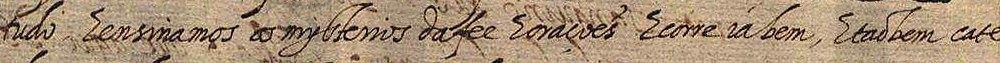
tudo E ensinamos os mysterios da fee E oraçoẽs E corre ia bem, E taõbem cate
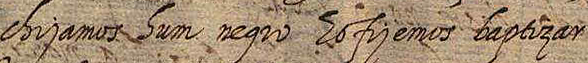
chizamos hum negro E o fizemos baptizar.
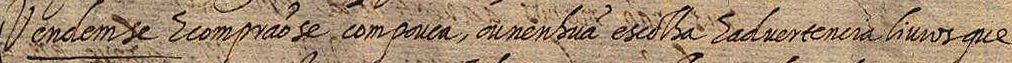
Vendemse E compraõse com pouca ou nenhuā escolha E aduertencia liuros que
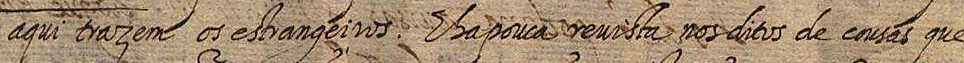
aqui trazem os estrangeiros. E ha pouca reuista nos ditos de cousas que
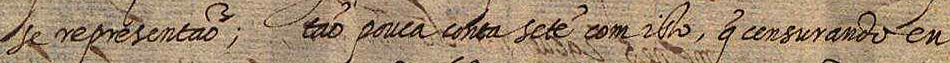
se representaõ; taõ pouca conta se tē com isto, q̄ censurando eu
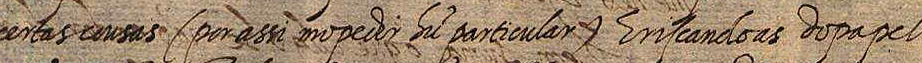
certas cousas (por assi mo pedir hū particular) E riscandoas do papel
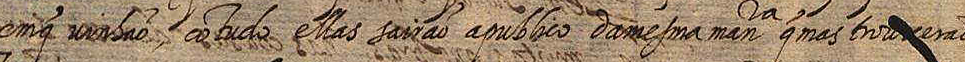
em q̄ uinhaõ, cōtudo ellas sairaõ a publico da mesma manra q̄ mas trouxeraõ
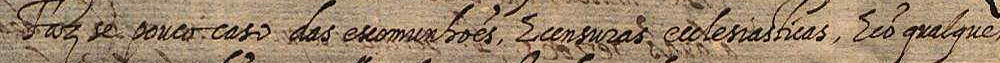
Faz se pouco caso das escomunhoẽs E censuras ecclesiasticas, E cō qualquer
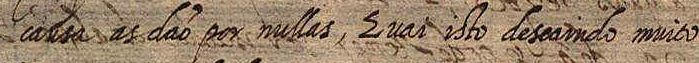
cousa as daõ por nullas, E uai isto descaindo muito.
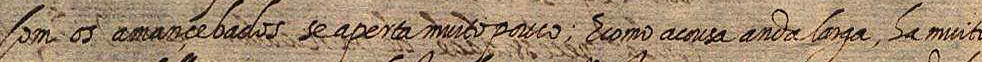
Com os amançebados se aperta muito pouco; E como a cousa anda larga, ha muitos
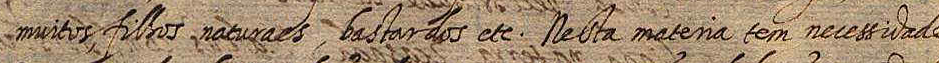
muitos, filhos naturaes, bastardos etc. Nesta materia tem necessidade
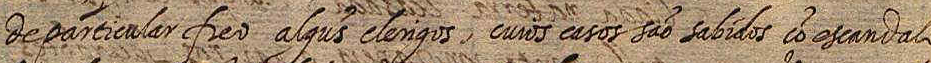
de particular freo algus̄ clerigos, cuios casos saõ sabidos cō escandalo.
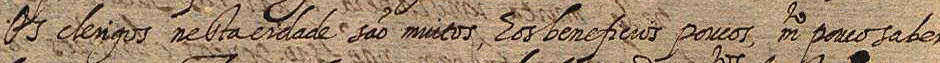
Os clerigos nesta cidade saõ muitos, E os beneficios poucos, mto pouco saber
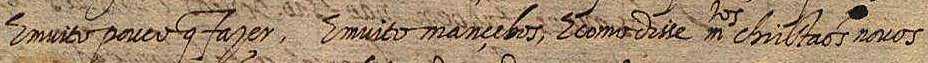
E muito pouco q̄ fazer, E muito mançebos, E como disse mtos christaõs nouos.
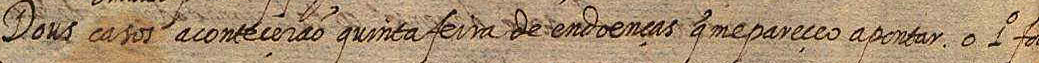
Dous casos aconteceraõ quinta feira de endoenças q̄ me pareçeo apontar. o 1o foi
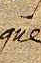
que
